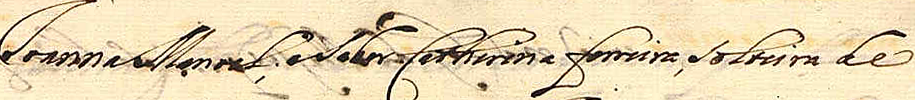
Ioanna Manoel, a saber Catherina ferreira, solteira de
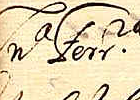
Cna Ferr.ra
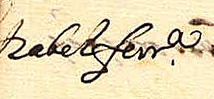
Izabel ferr.a
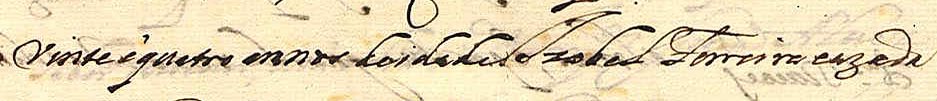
vinte e quatro annos de idade e Izabel Ferreira cazada
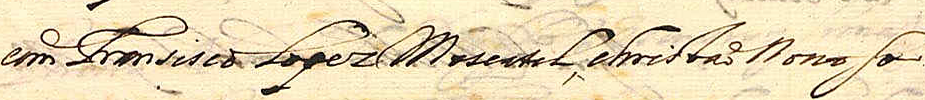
com Francisco Lopez MoscateL, christaõ Nouo So
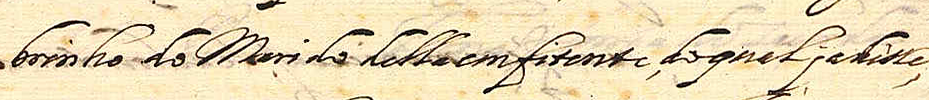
brinho do Marido della confitente, do qual ja disse,
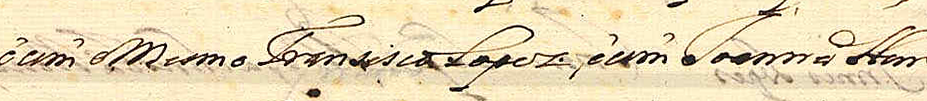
e com o Mesmo Francisco Lopez, e com Ioanna Hen
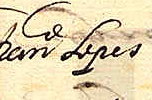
ranco Lopes
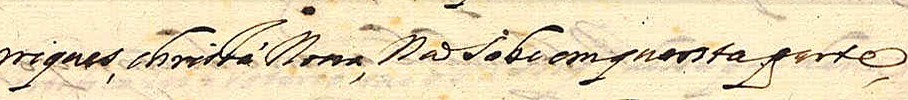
rriques, christā Noua, Nā sabe em quanta parte,
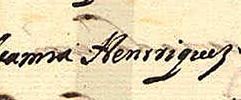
oanna Henrriques
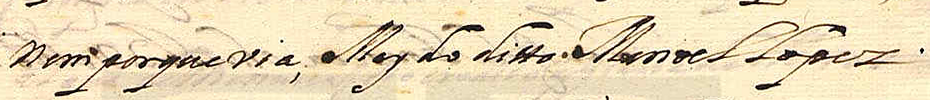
nem por que via, May do ditto Manoel Lopez
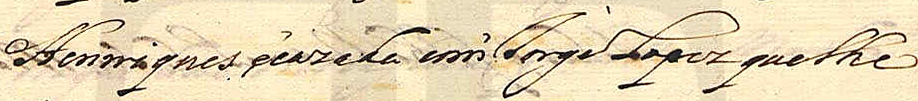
Henrriques, e cazada com Iorge Lopez que lhe
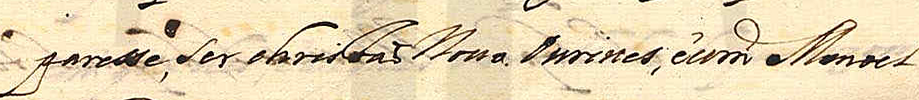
paresse, ser christaõ Nouo ouriues, e com Manoel
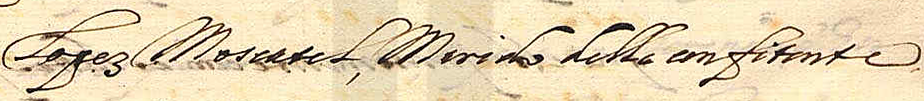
Lopez MoscateL, Marido della confitente
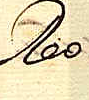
Reo
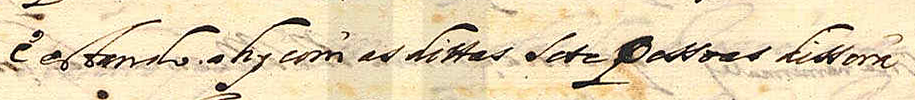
e estando ahy com as dittas sete pessoas dissera
